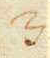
3
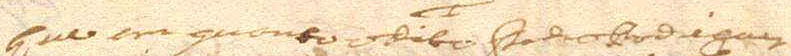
que emquanto o dito Pedro Rodrigues
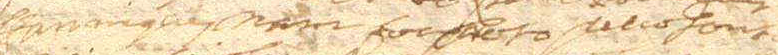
Hanrriques nam foi preso pello santo
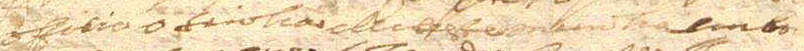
officio o tinha elle testemunha em boa
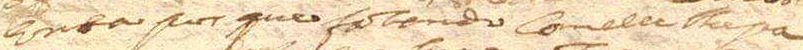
conta porque falando Com elle lhe pa
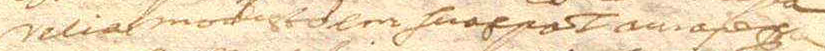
recia modesto em suas palauras e fre
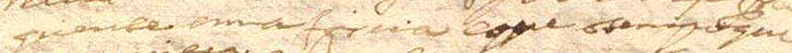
quente em a Jgreia e que o tempo que
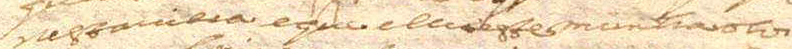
nesta uilla e que elle testemunha o co
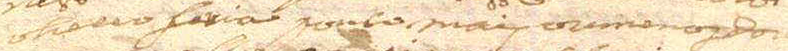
nheceo faria pouco mais ou menos dous
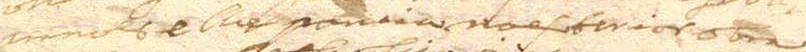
annos e lhe parecia no exterior obra
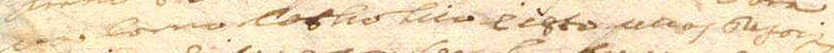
ua como Catholico e isto pellas Rezois
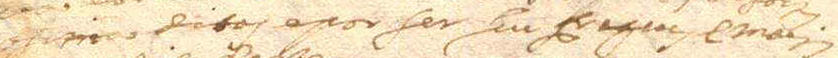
asima ditas e por ser seu fregues e mais
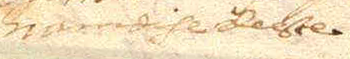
nam dise deste
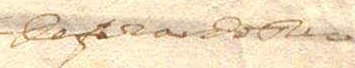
Defeza do Reo
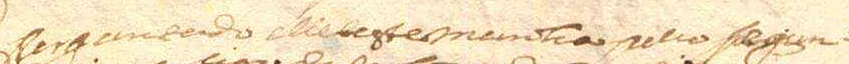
perguntado elle testemunha pello segun
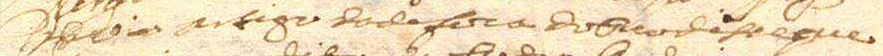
do artigo da defeza do Reo disse o que
